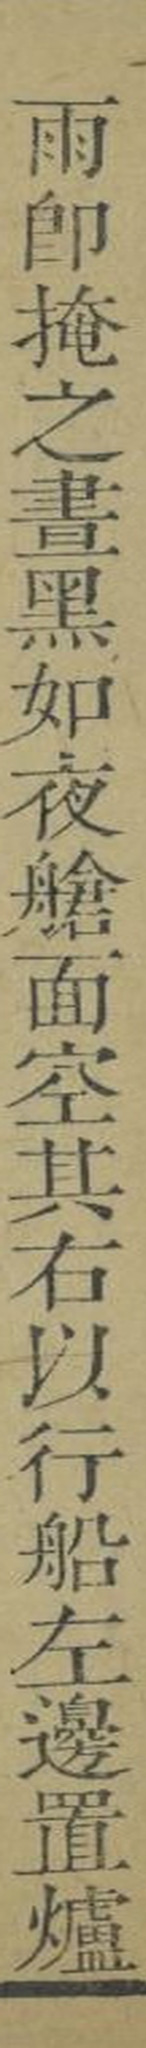雨卽掩之晝黑如夜艙面空其右以行船左邊置爐
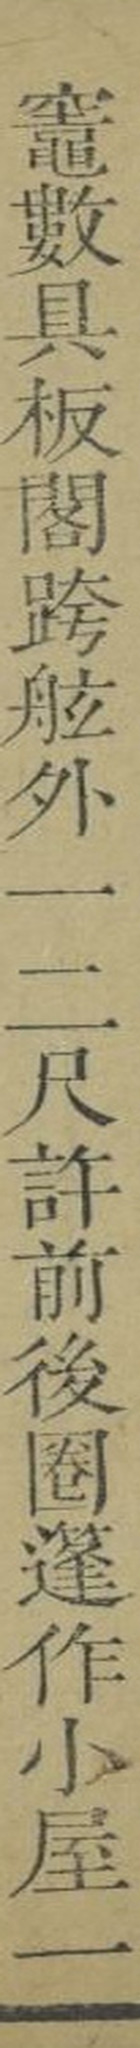竈數具板閣跨舷外一二尺許前後圈篷作小屋一
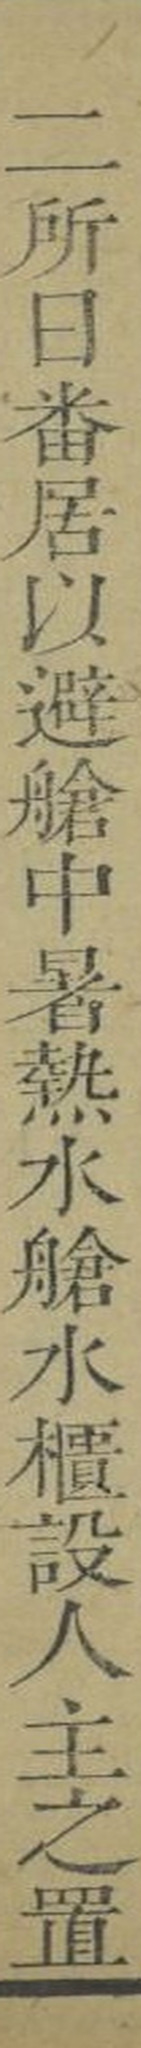二所日畨居以避艙中暑𤍠水艙水櫃設人主之置
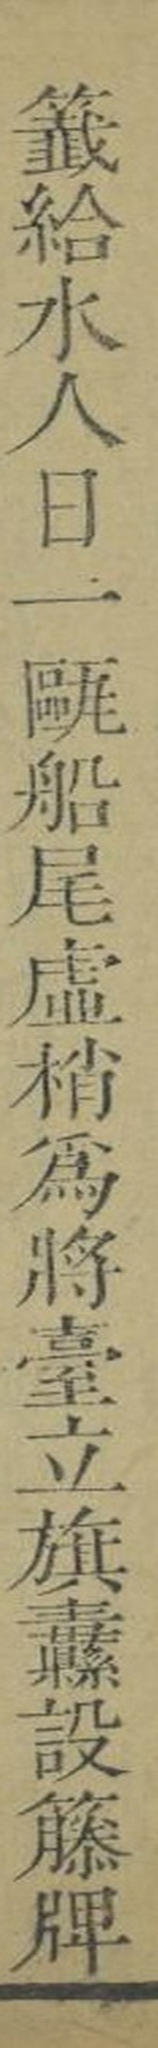籖給水人日一甌船尾虚梢爲將臺立旗纛設籐牌
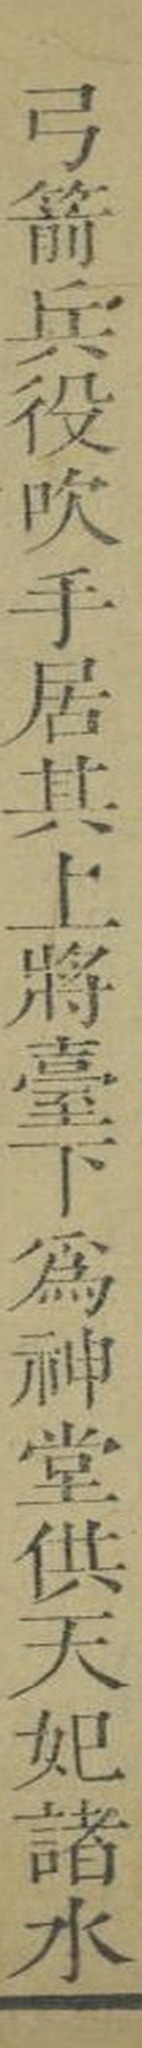弓箭兵役吹手居其上將臺下爲神堂供天妃諸水
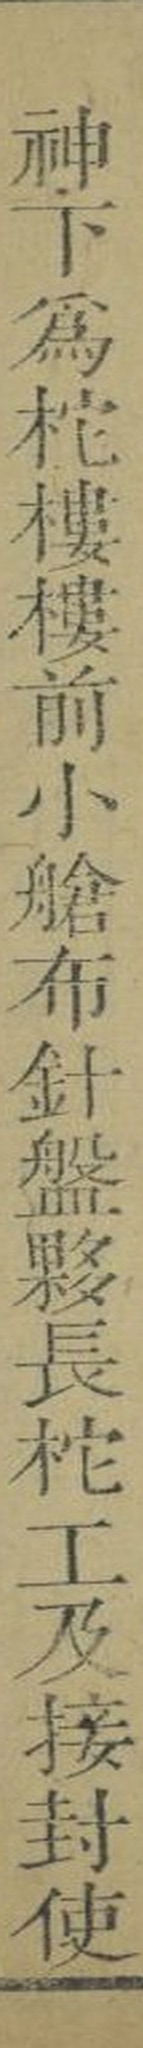神下爲柁樓樓前小艙布針盤夥長柁工及接封使
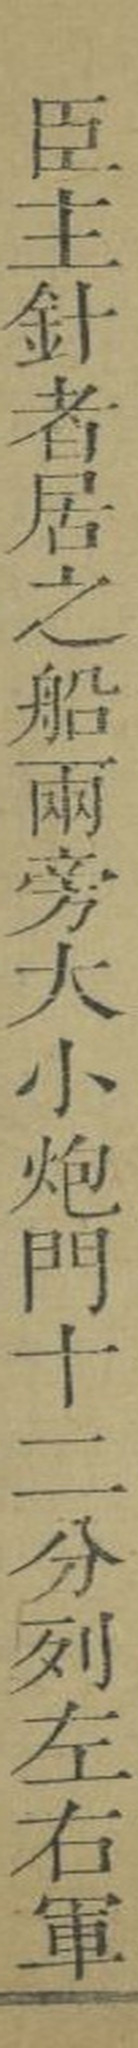臣主針者居之船兩旁大小炮門十二分列左右軍
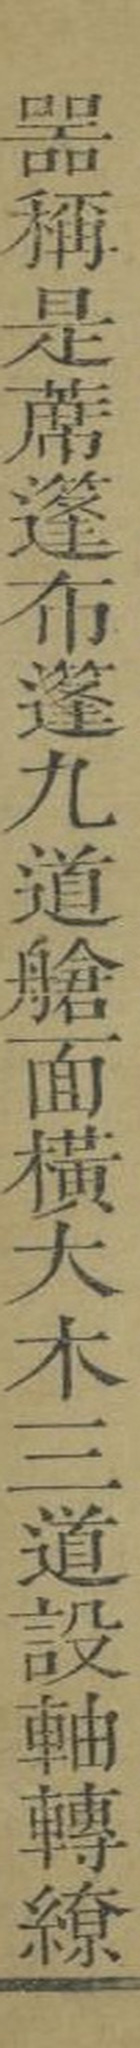噐稱是蓆篷布篷九道艙面橫大木三道設軸轉繚

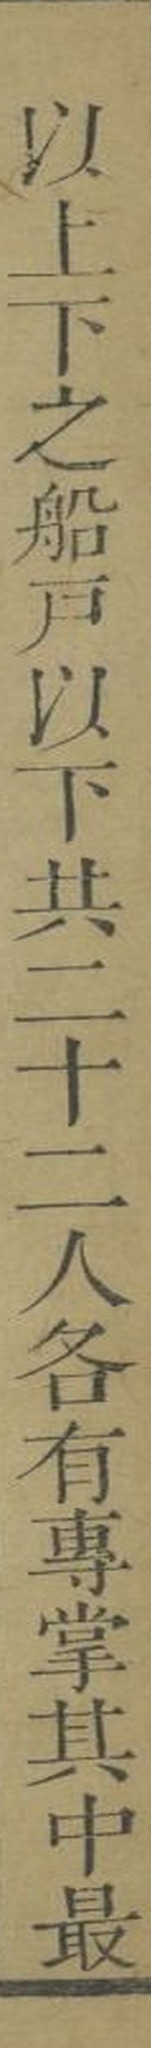以上下之船戸以下共二十二人各有專掌其中最
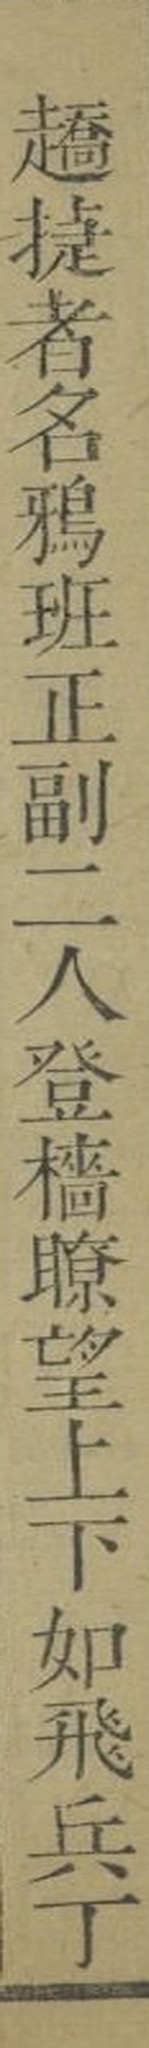趫㨗者名鴉班正副二人登檣瞭望上下如飛兵丁
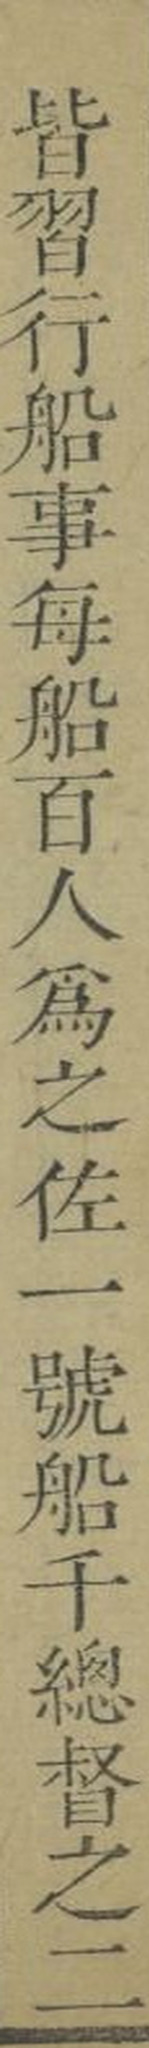皆習行船事每船百人爲之佐一號船千總督之二
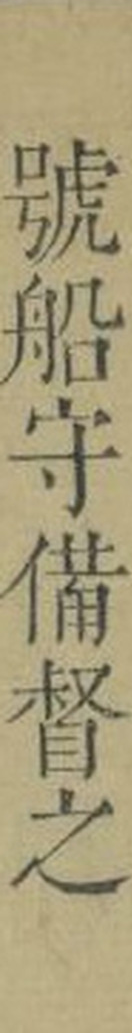號船守備督之
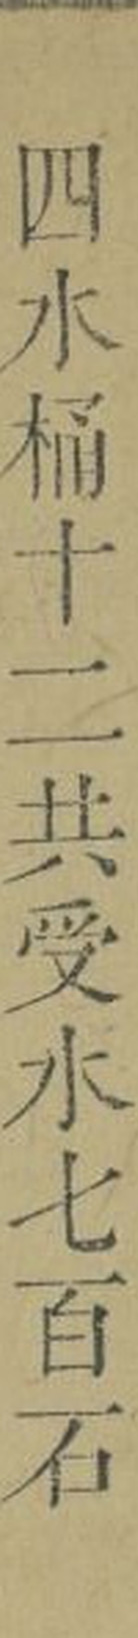四水桶十二共受水七百石
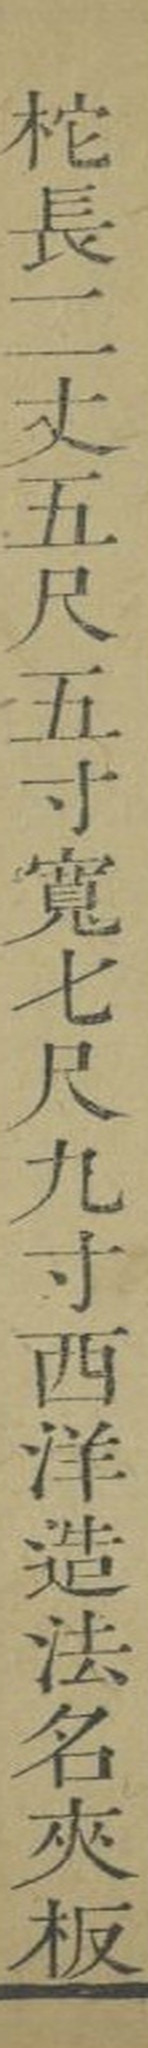柁長二丈五尺五寸寬七尺九寸西洋造法名夾板
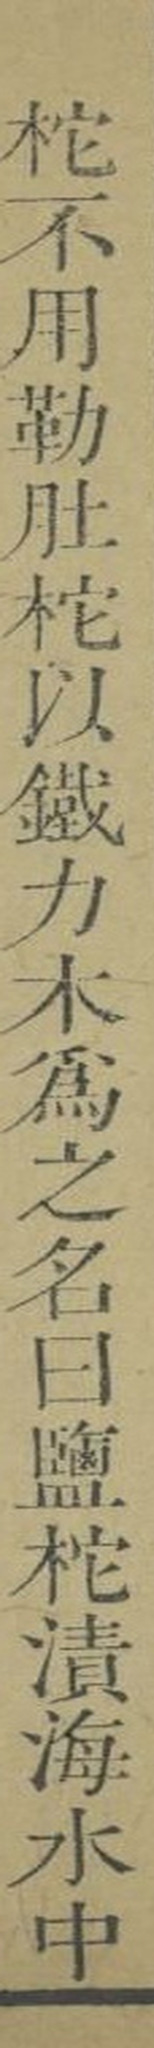柁不用勒肚柁以鐵力木爲之名曰鹽柁漬海水中

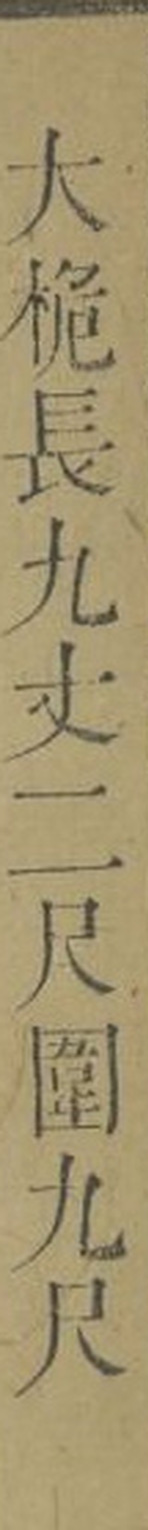大桅長九丈二尺圍九尺
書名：中山伝信録 巻一
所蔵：University of the Ryukyus Library
